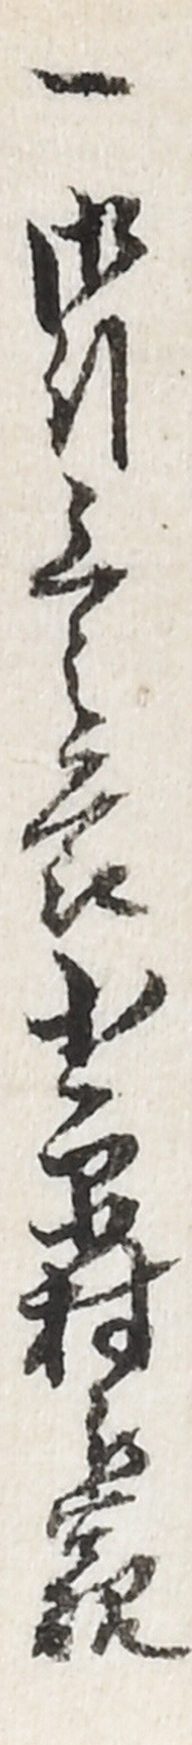一御引上之節小原村江窺
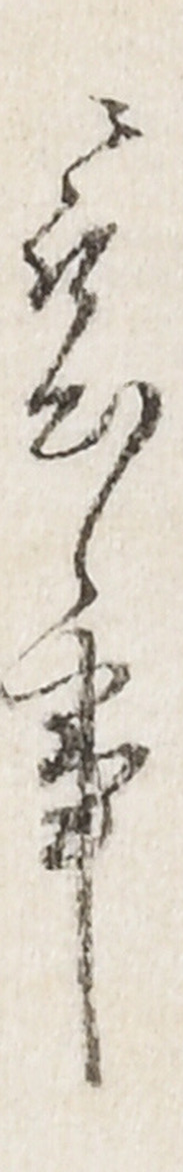ニ罷出候事
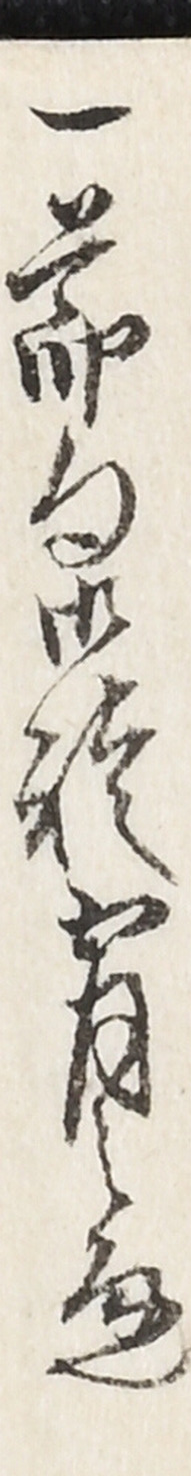一節句御礼五月之通
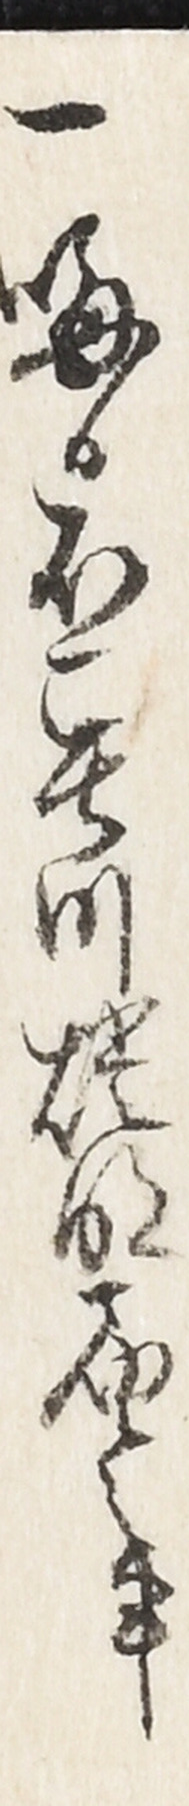一晦日ほこち川燈明届之事
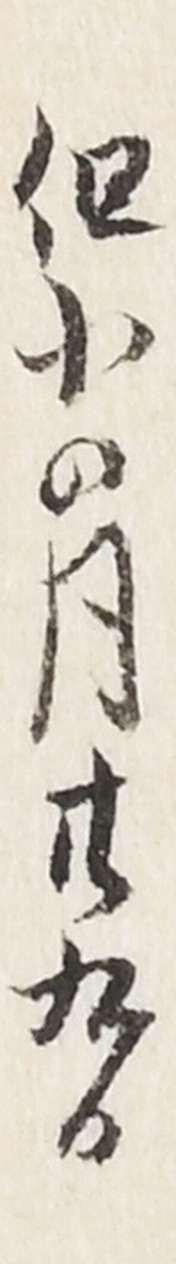但小の月廿九日

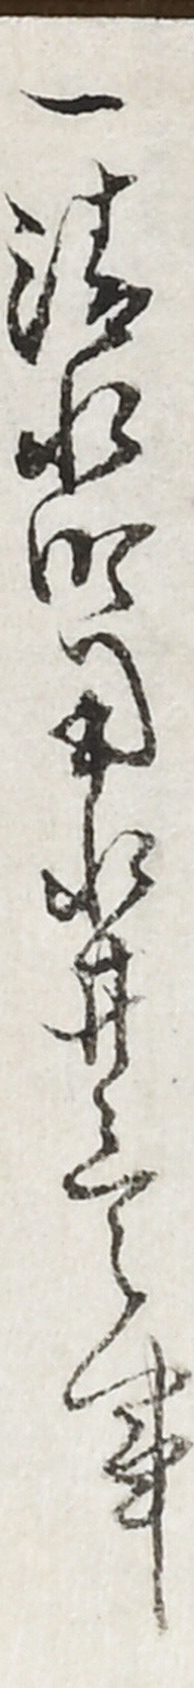一清水町用水并上之事
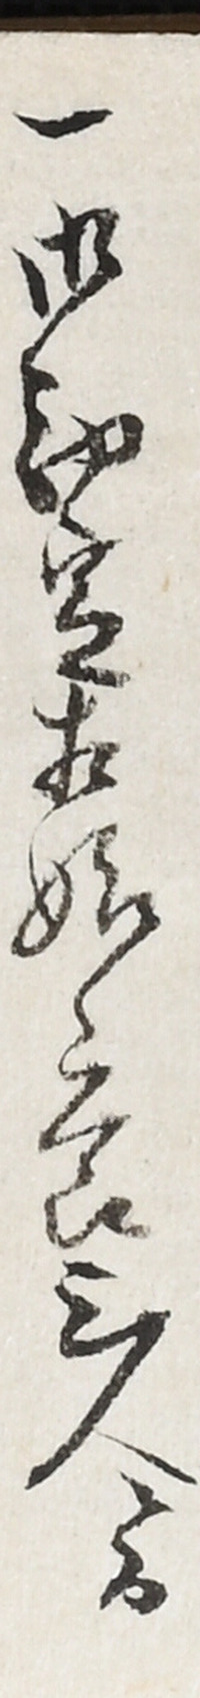一御勘定相始候節三人ニ而
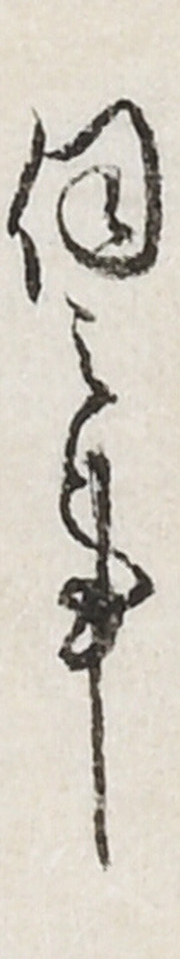伺之事
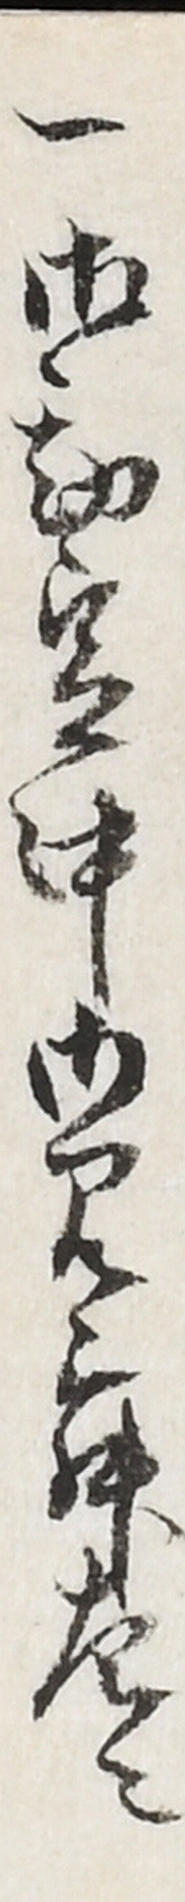一御勘定中御見舞左ニ
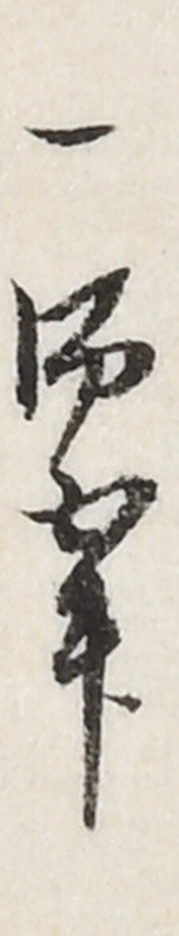一酒五升
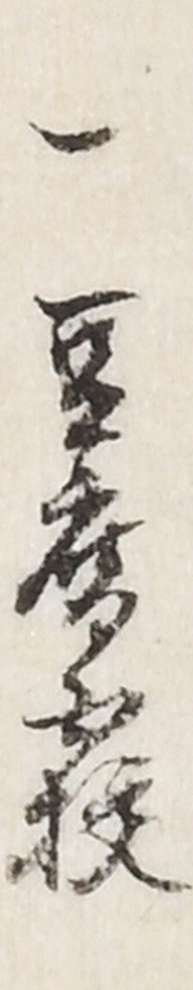一豆腐五晩
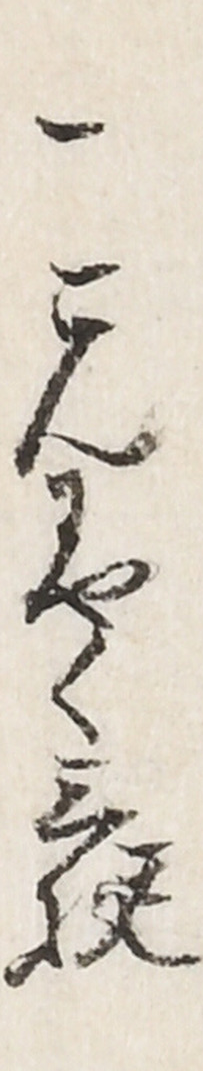一こんにやく三晩
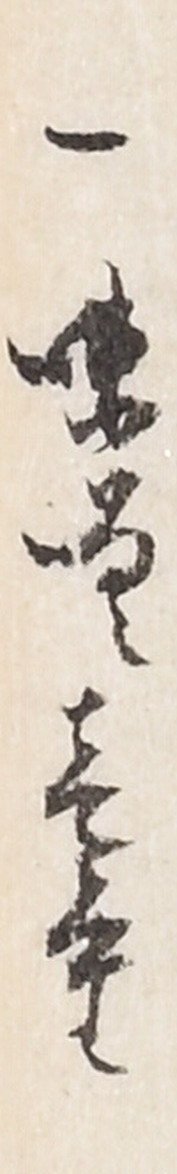一味噌に壱重
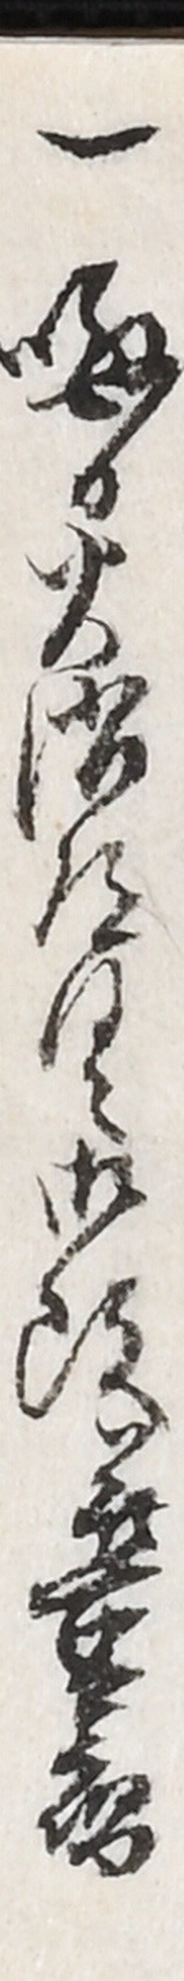一晦日火消道具御改并豆腐
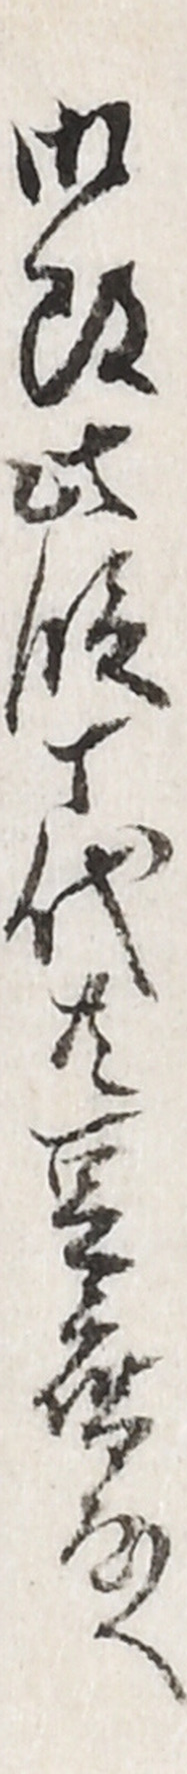御改此段丁代共豆腐なへ
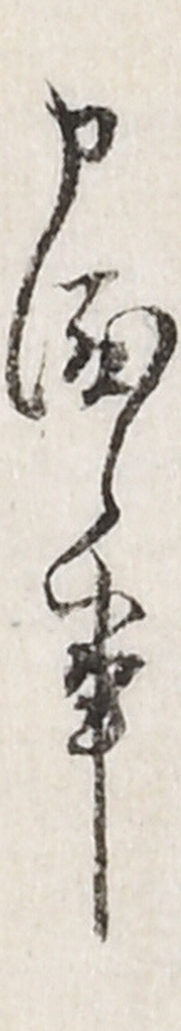申渡候事
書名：年内行事懐中録
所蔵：伊那市立高遠町図書館・合同会社AMANE
